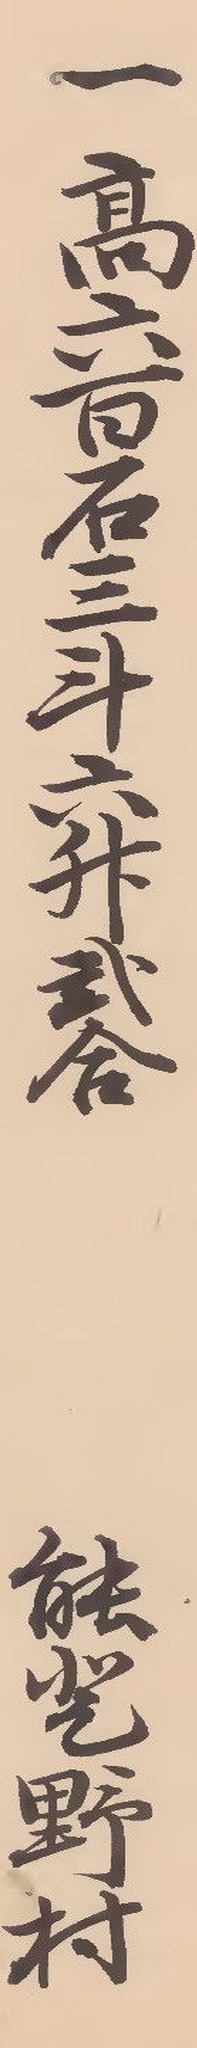一高六百石三斗六升弐合能登野村
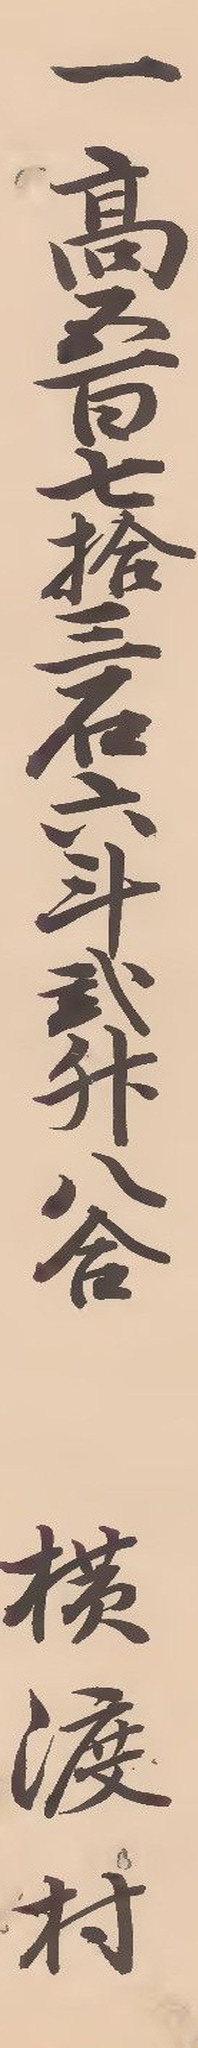一高五百七拾三石六斗弐升八合横渡村
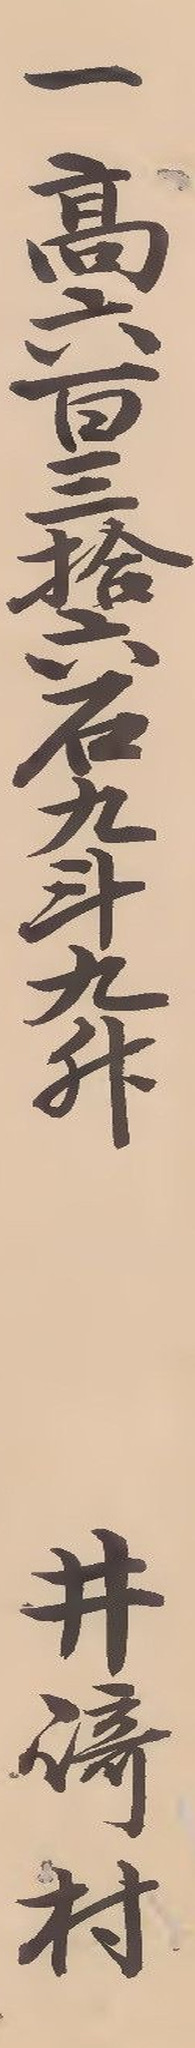一高六百三拾六石九斗九升井崎村
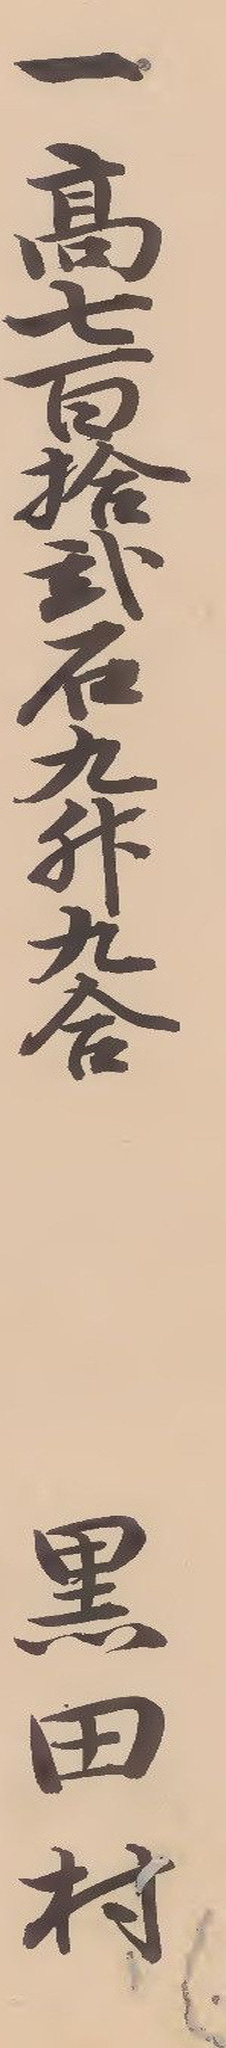一高七百拾弐石九升九合黒田村
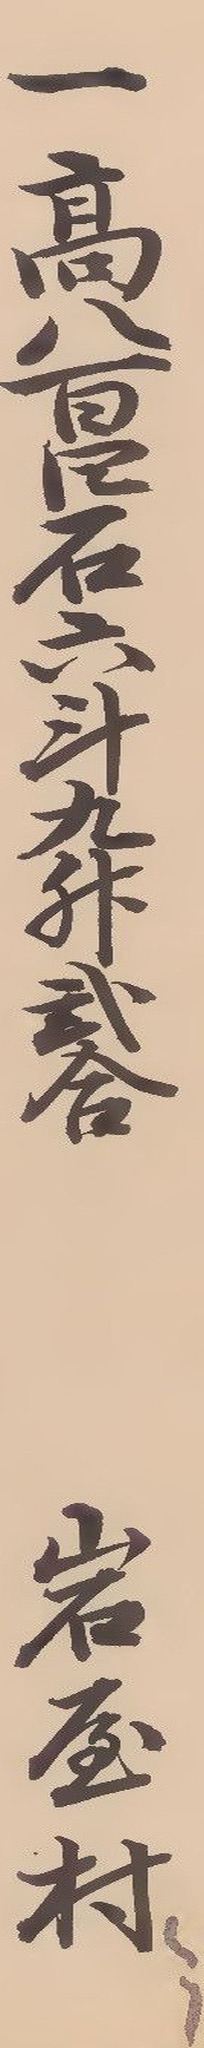一高八百四石六斗九升弐合岩屋村
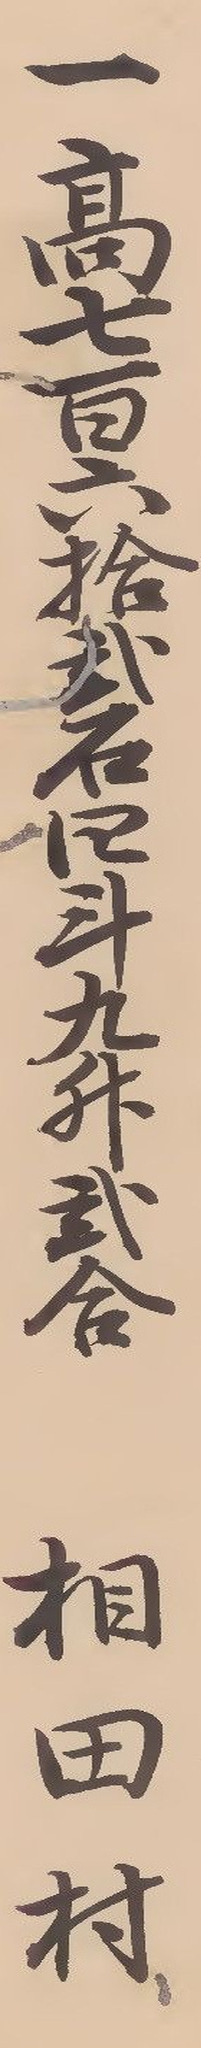一高七百六拾弐石四斗九升弐合相田村

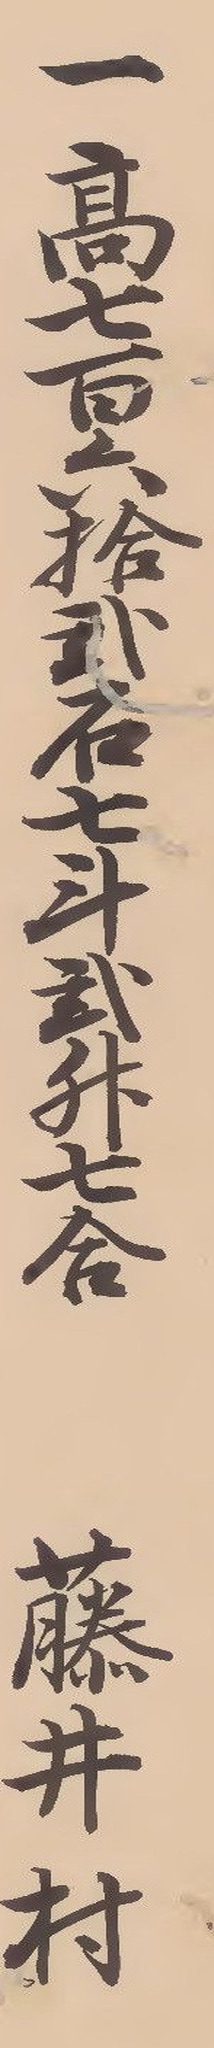一高七百六拾弐石七斗弐升七合藤井村
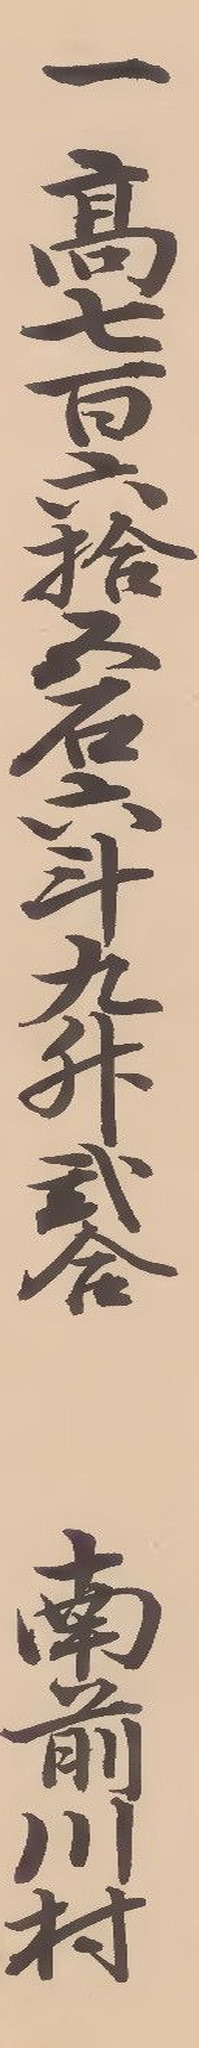一高七百六拾五石六斗九升弐合南前川村
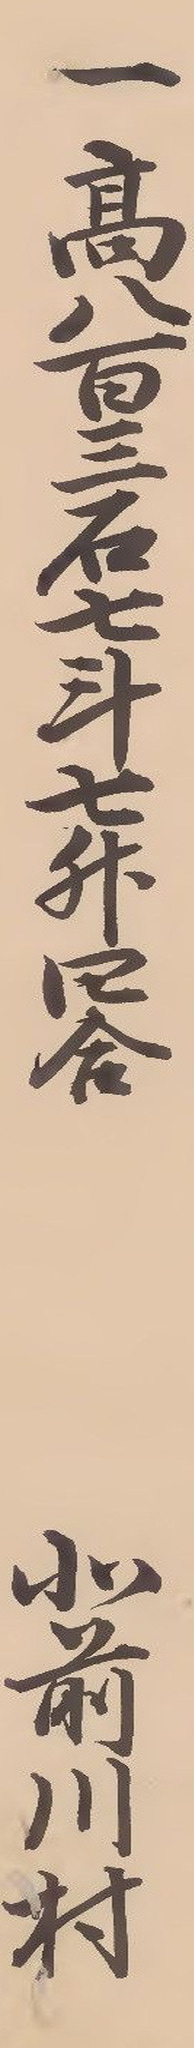一高八百三石七斗七升四合北前川村
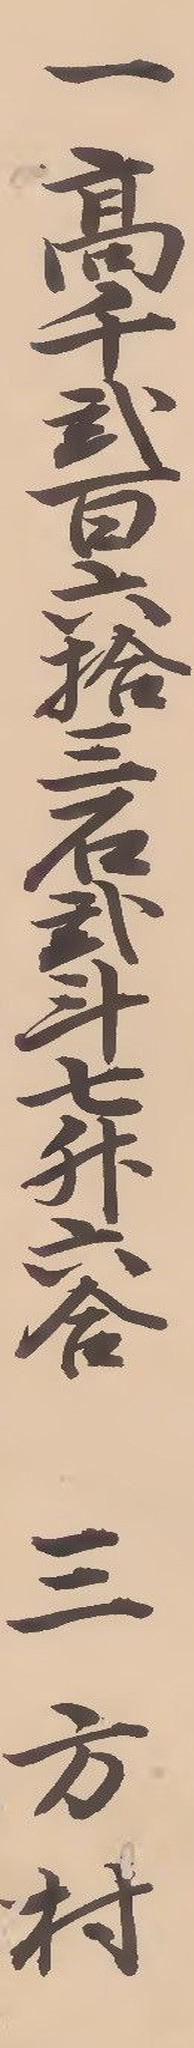一高千弐百六拾三石弐斗七升六合三方村
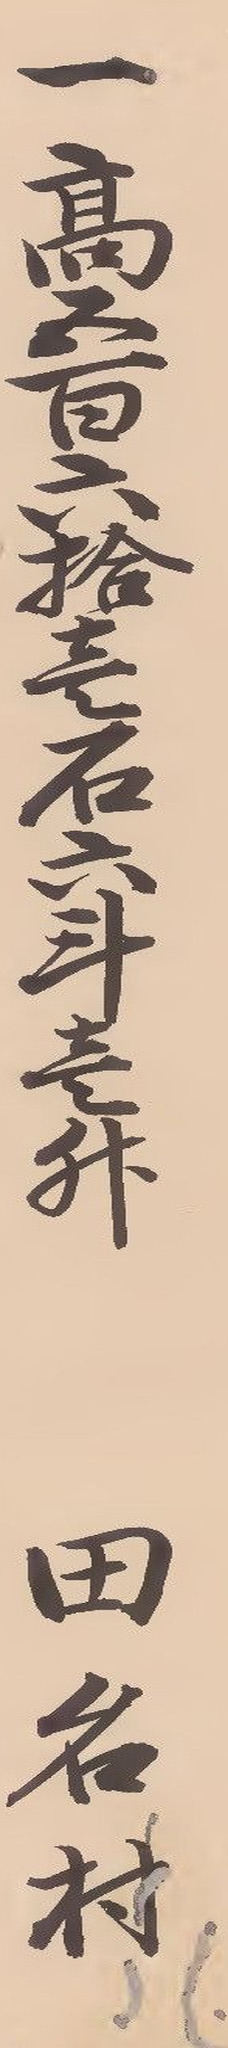一高五百六拾壱石六斗壱升田名村
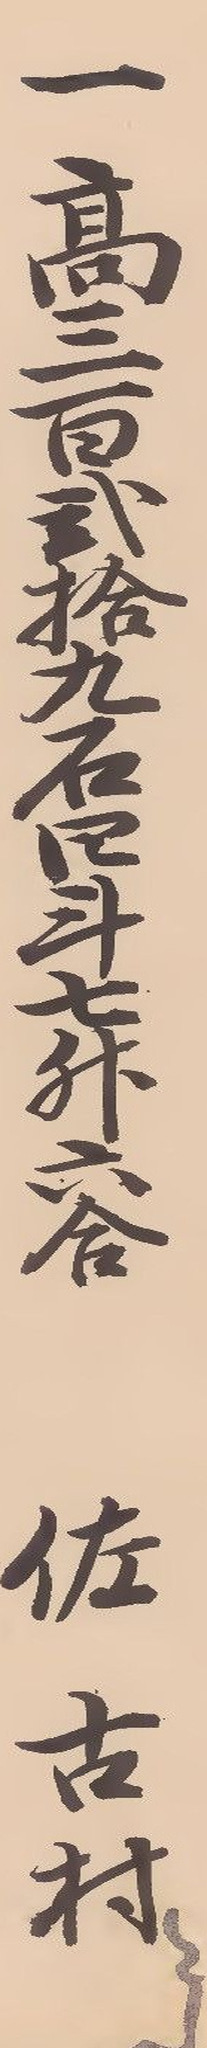一高三百弐拾九石四斗七升六合佐古村
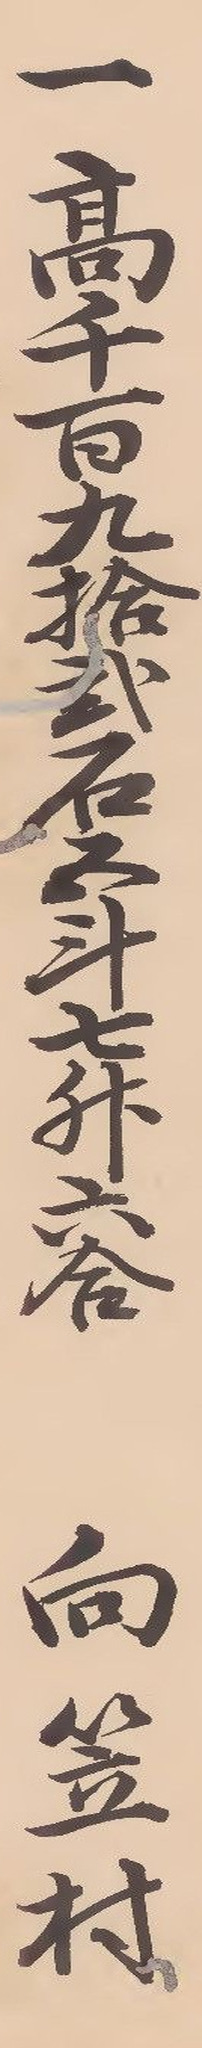一高千百九拾弐石五斗七升六合向笠村

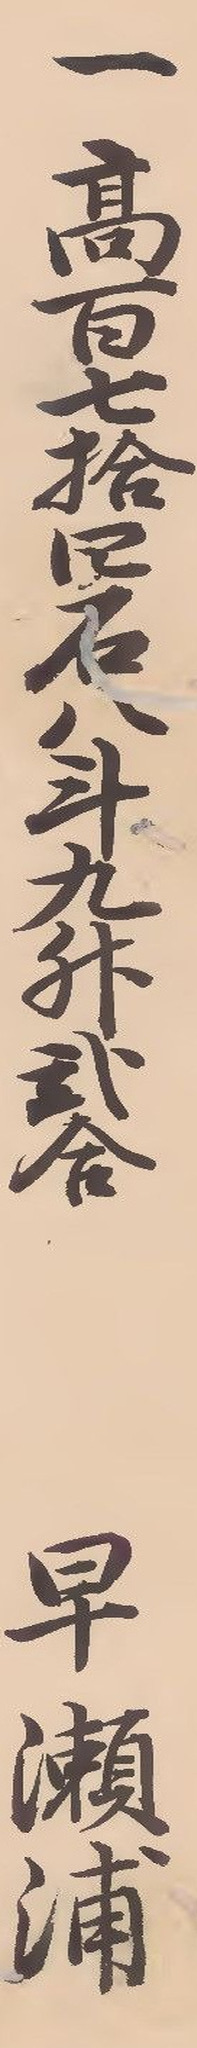一高百七拾四石八斗九升弐合早瀬浦
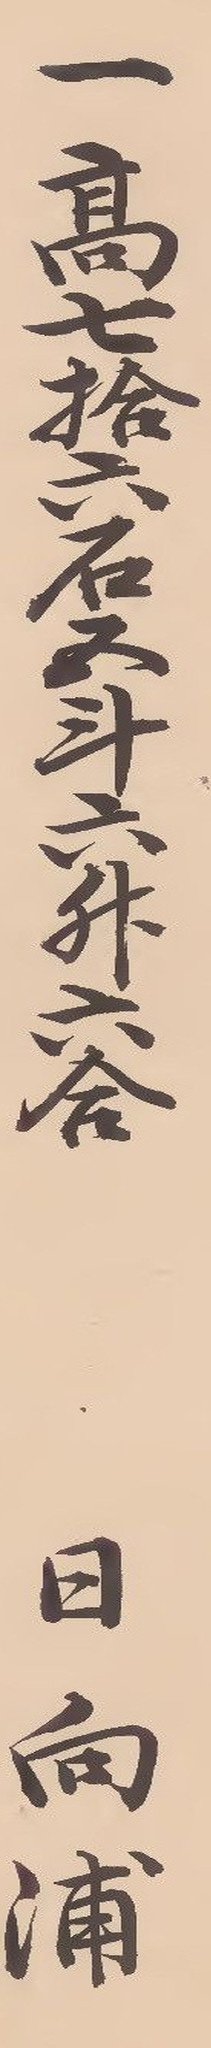一高七拾六石五斗六升六合日向浦
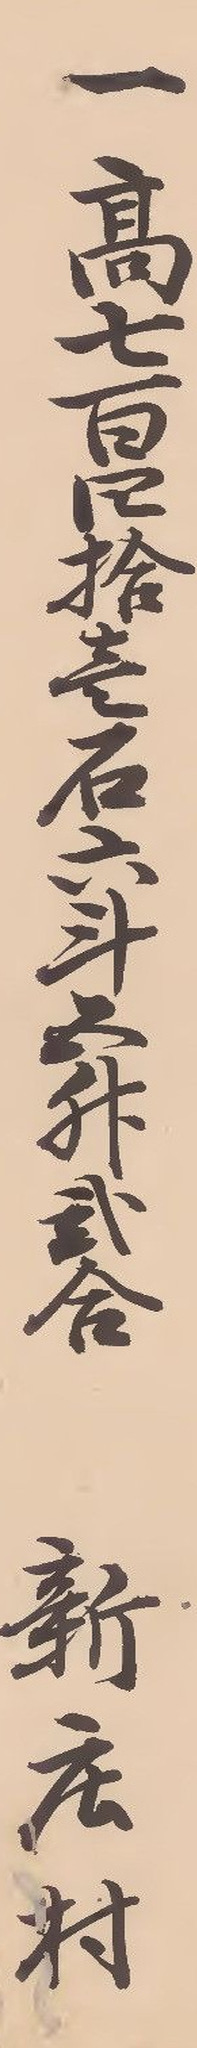一高七百四拾壱石六斗五升弐合新庄村
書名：若狭国郷帳
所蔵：国立公文書館 National Archives of Japan
